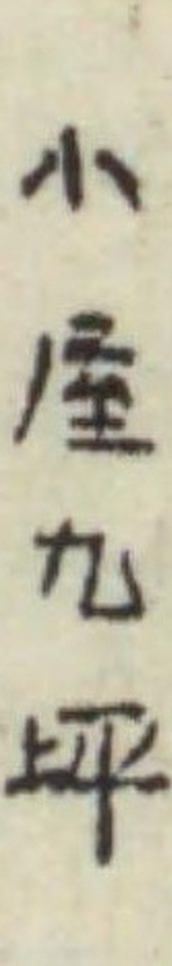小屋九坪
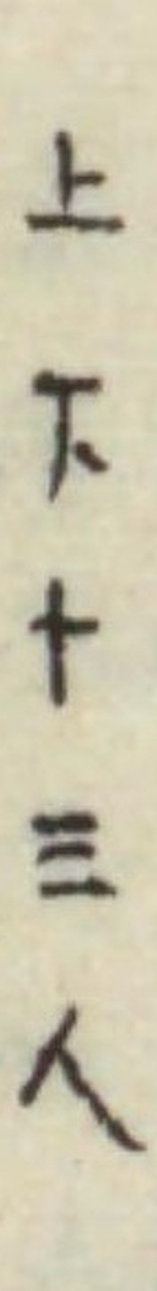上下十三人
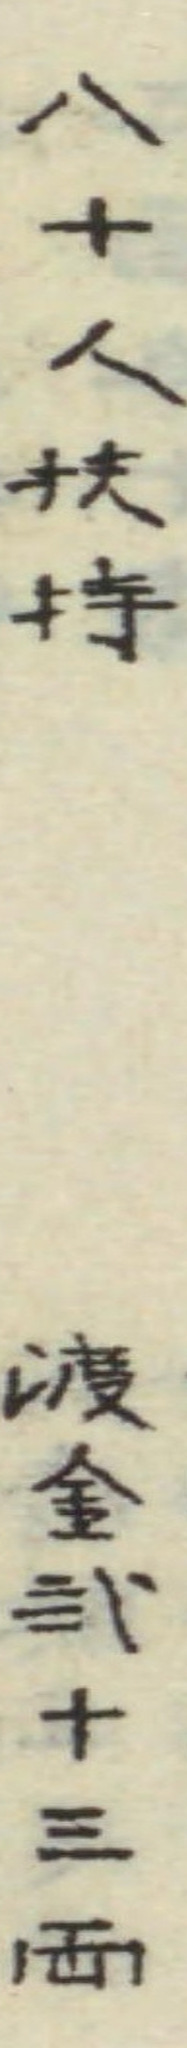八十人扶持渡金弐十三両
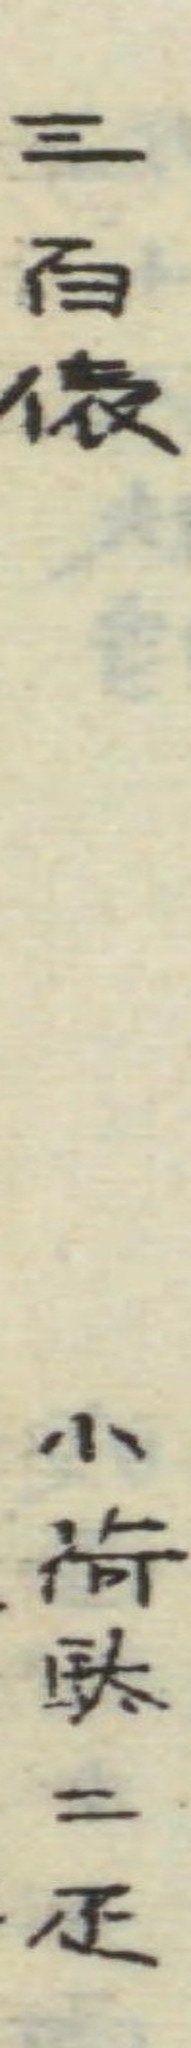三百俵小荷駄二疋
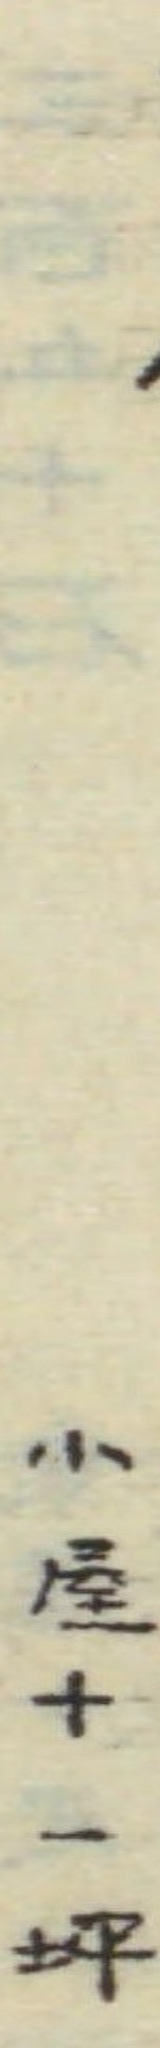小屋十一坪
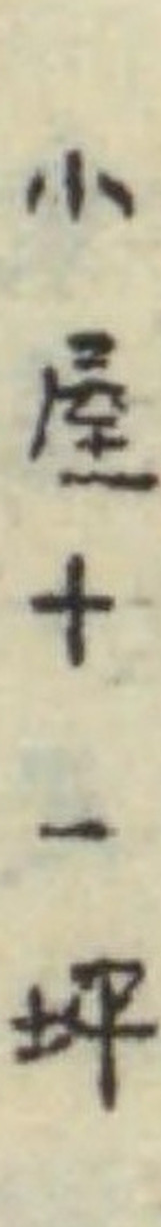小屋十一坪
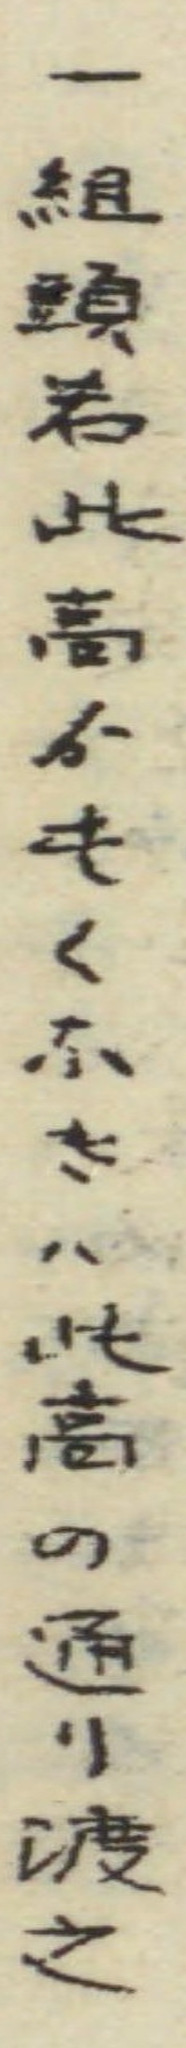一組頭若此高ゟすくなきハ此高の通り渡之

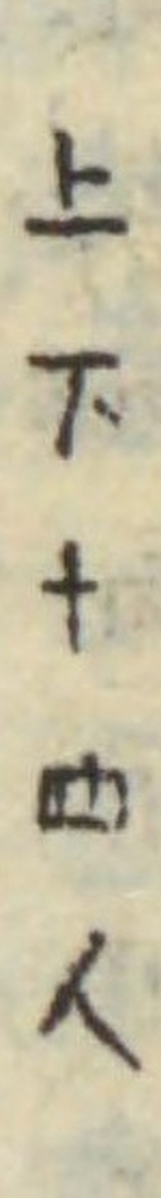上下十四人
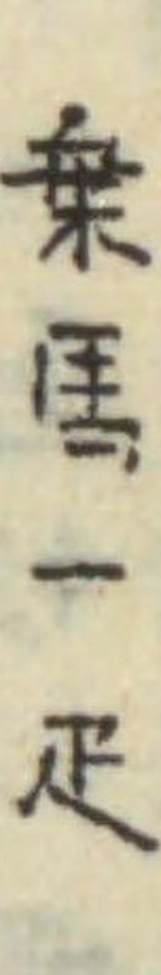乗馬一疋
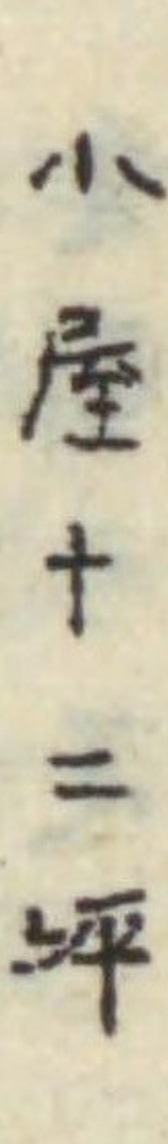小屋十二坪
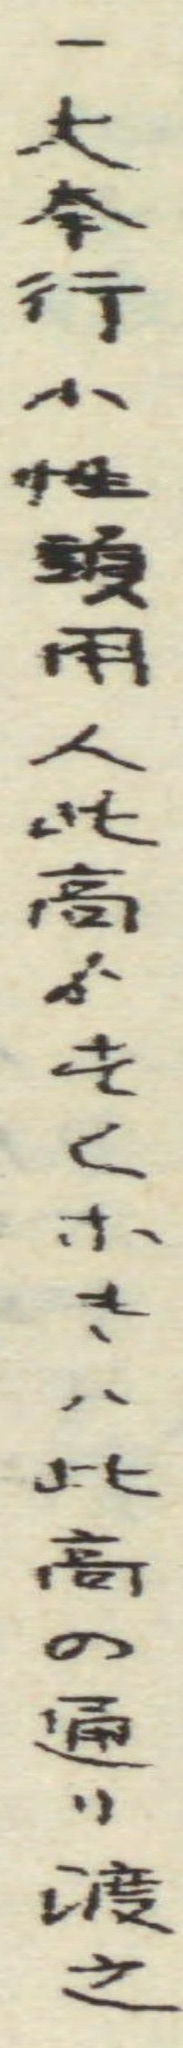一大奉行小姓頭用人此高ゟすくなきハ此高の通り渡之
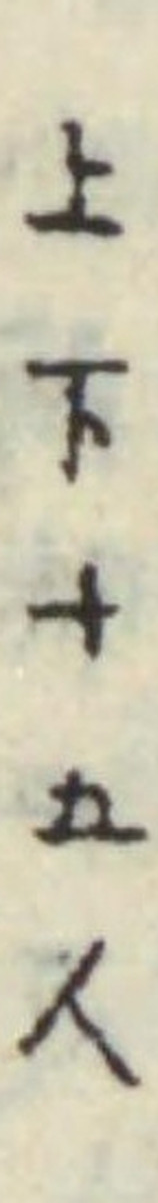上下十五人
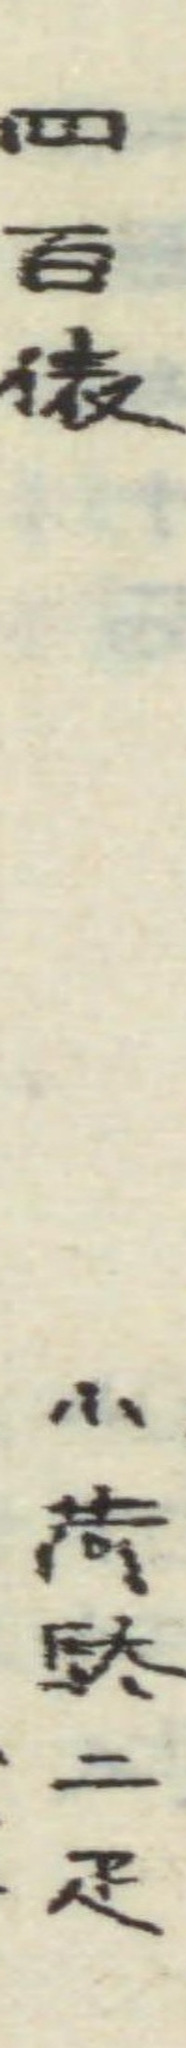四百俵小荷駄二疋
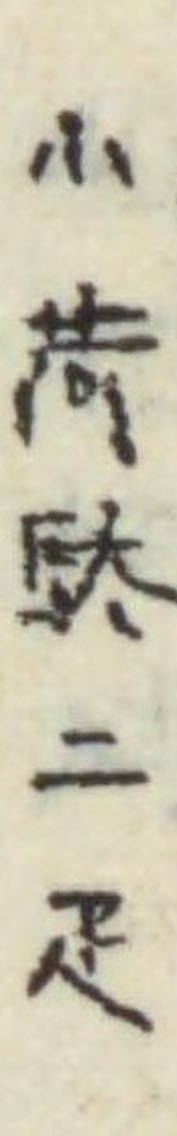小荷駄三疋
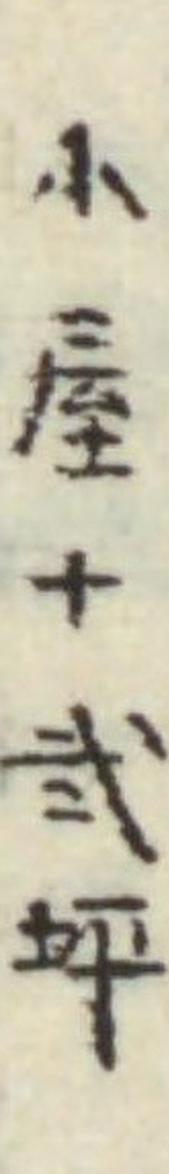小屋十弐坪
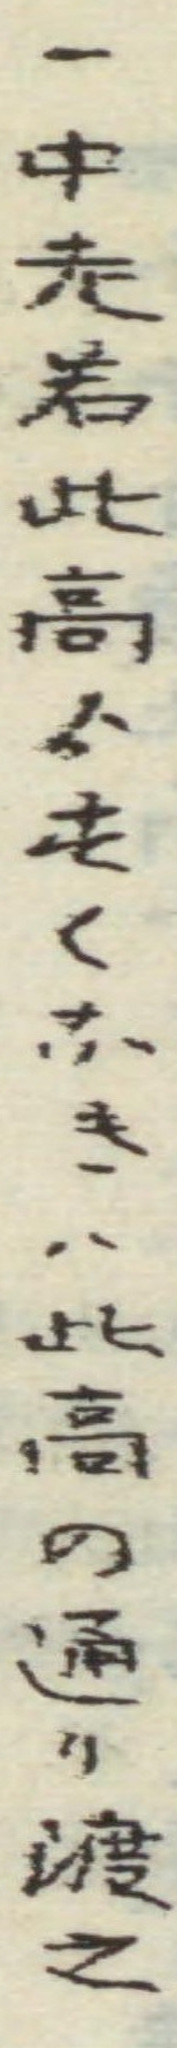一中老若此高ゟすくなきハ此高の通り渡之
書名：三河吉田藩動員史料
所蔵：国立国会図書館 National Diet Library, JAPAN
